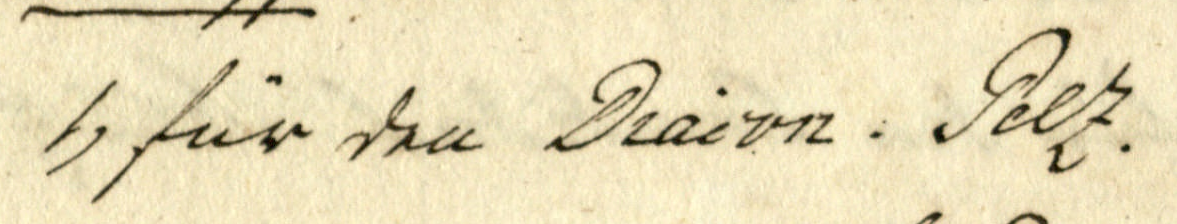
1. für den Diacon. Pelz.
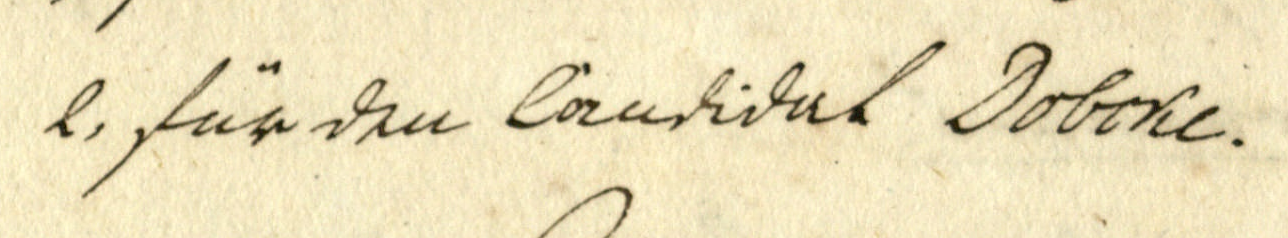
2, für den Candidat Dobcke.
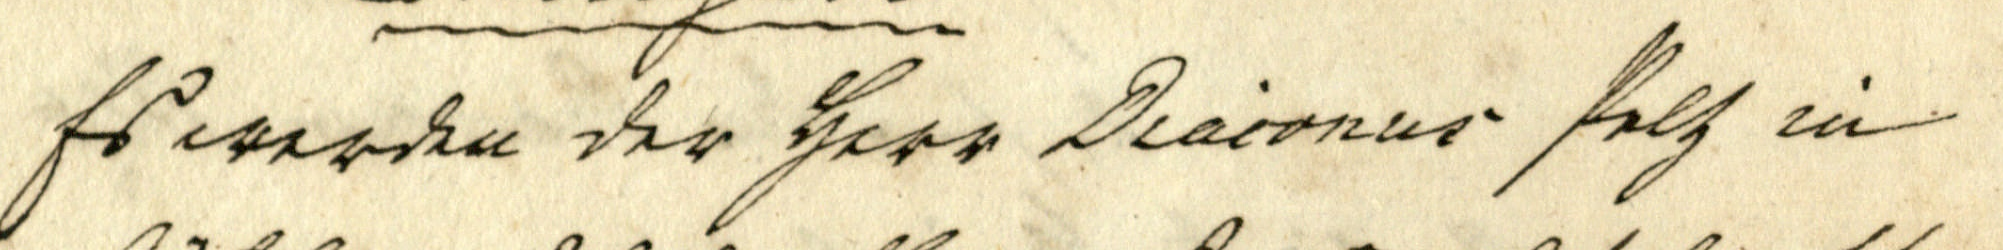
Es werden der Herr Diaconus Pelz in
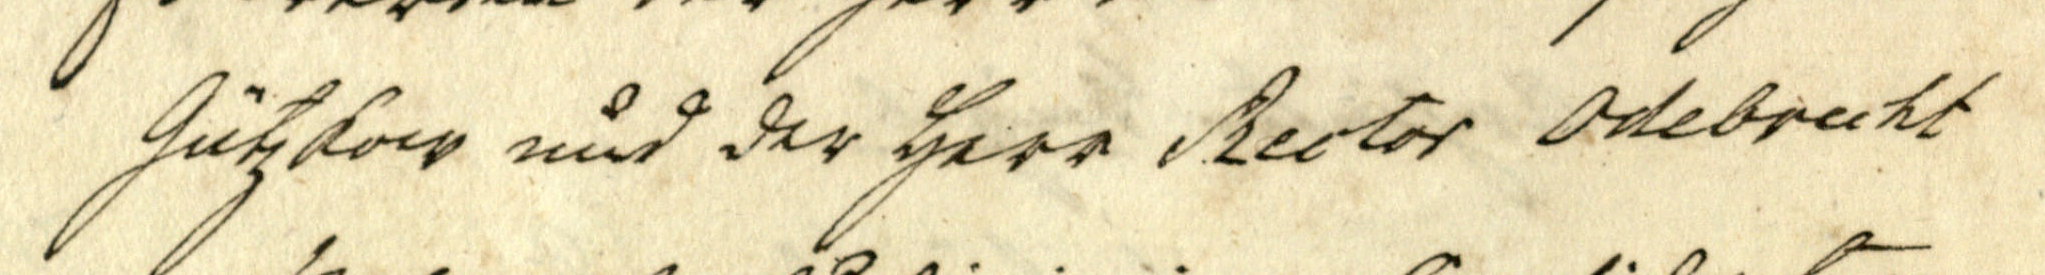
Gützkow und der Herr Rector Odebrecht
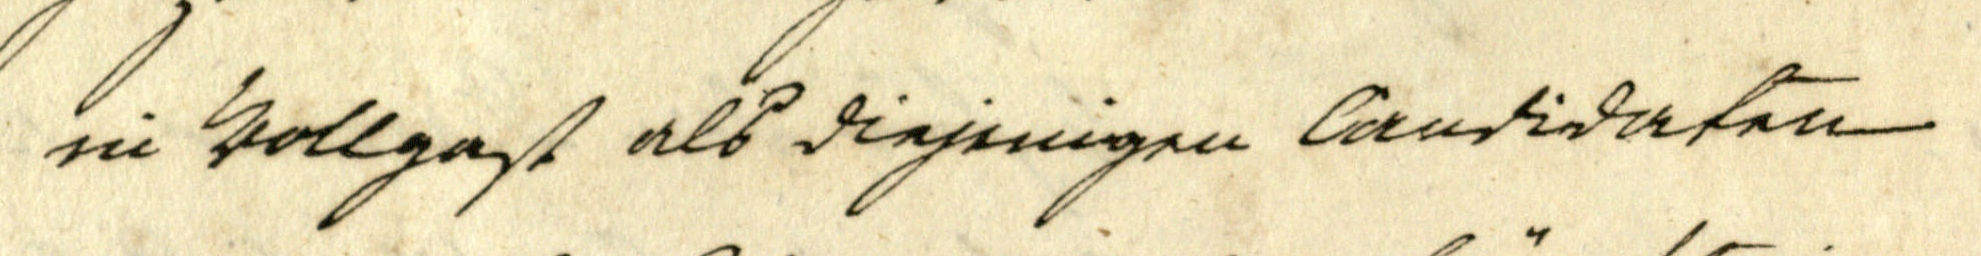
in Wollgast als diejenigen Candidaten
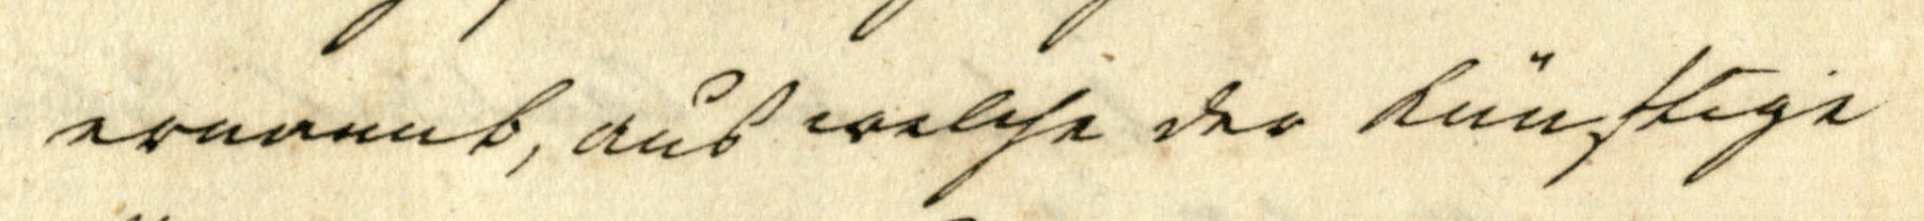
ernannt, aus welche der künftige
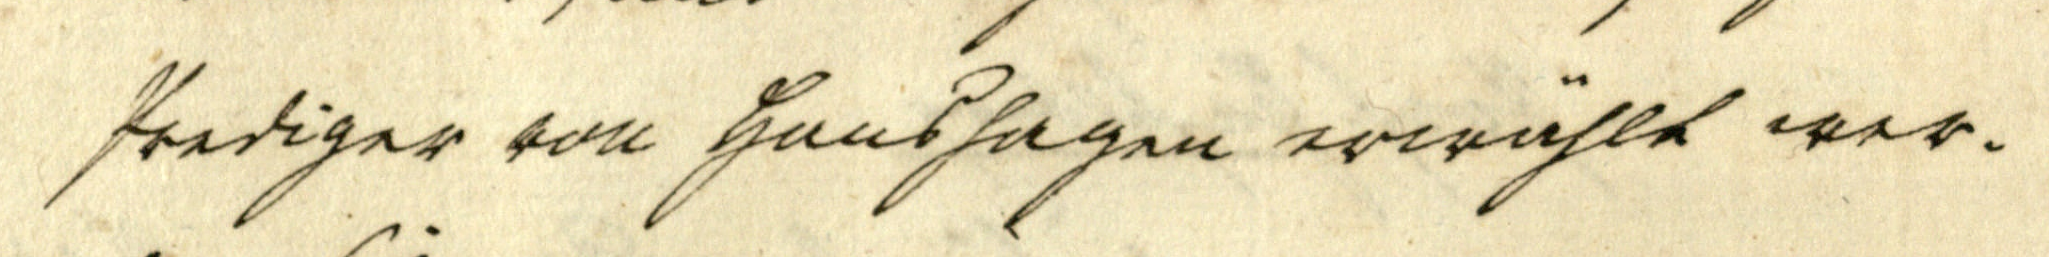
Prediger von Hanshagen erwählt wer¬
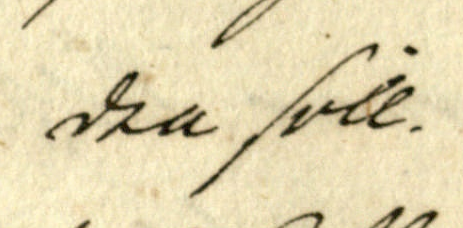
den soll.
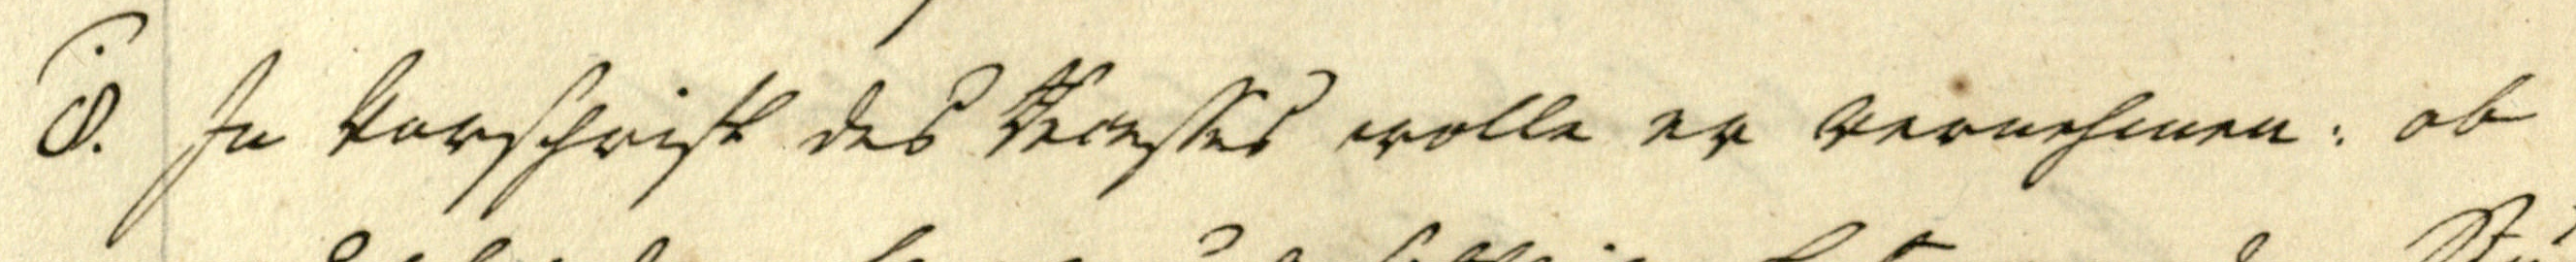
8. In Vorschrift des Recesses wolle er vernehmen: ob
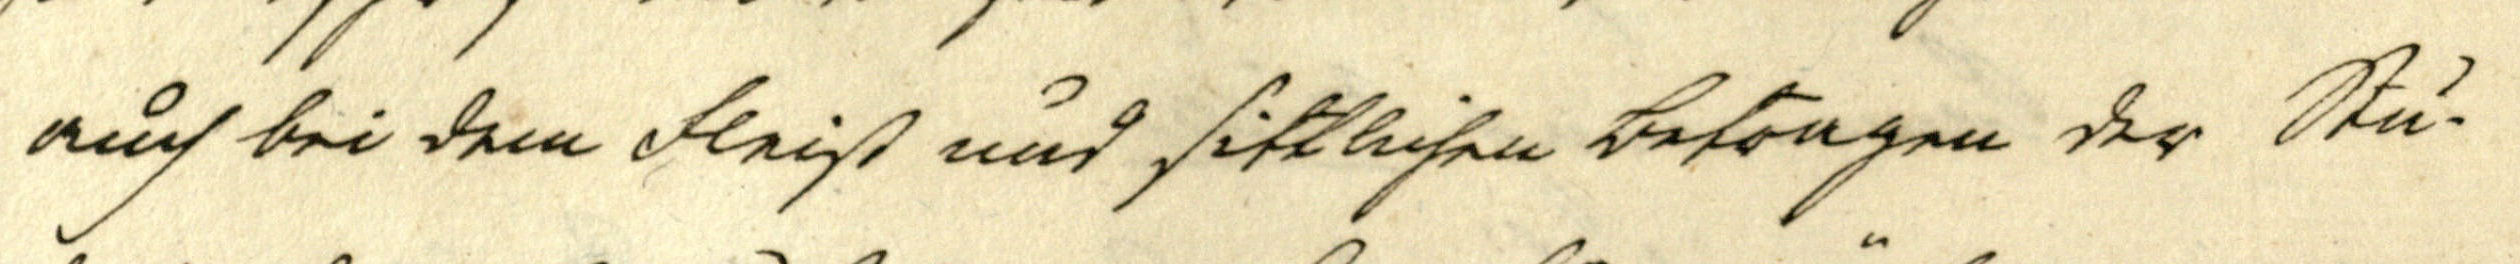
auch bei dem Fleiß und sittlichen Betragen der Stu¬
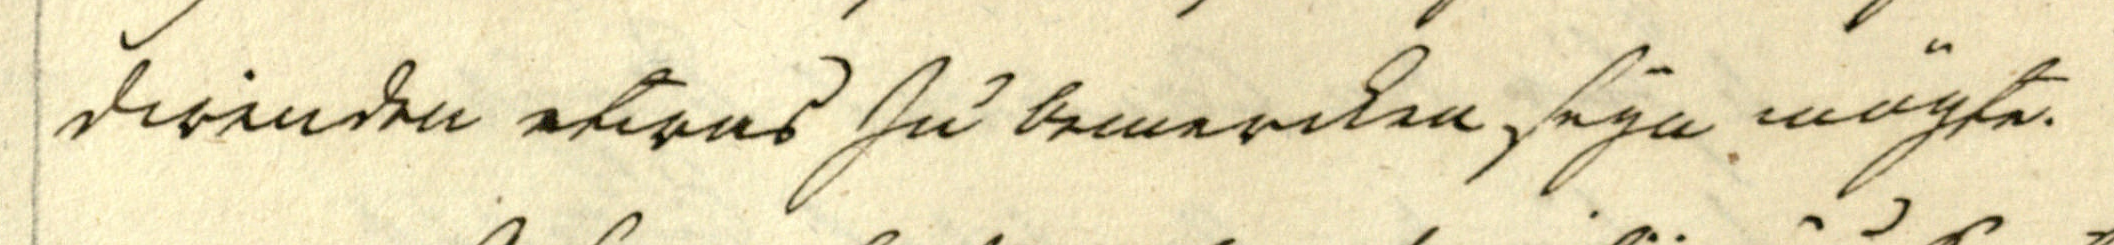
direnden etwas zu bemercken seÿn mögte.
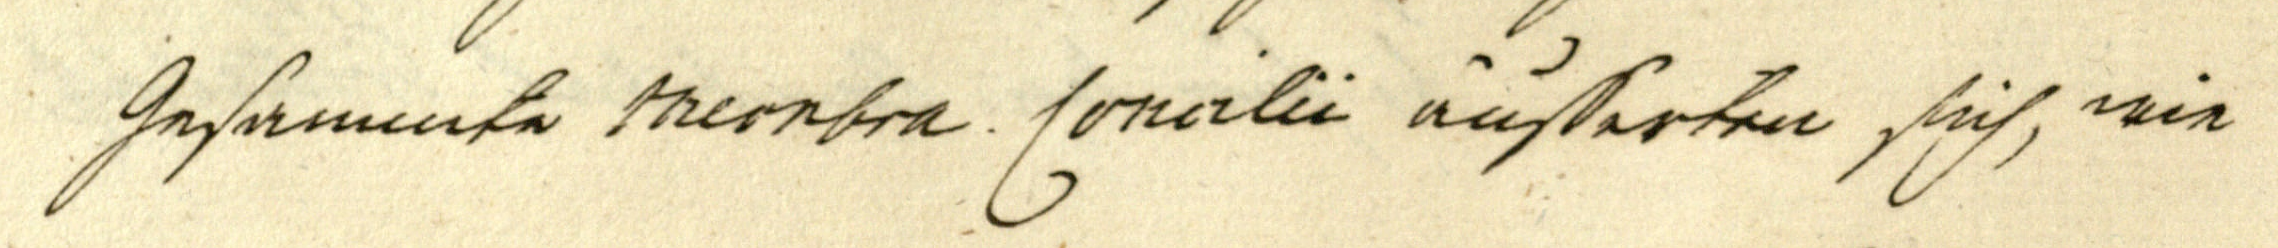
Gesammte Membra Concilii äusserten sich, wie
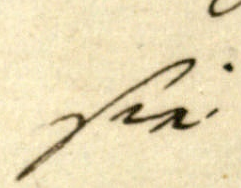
sie
